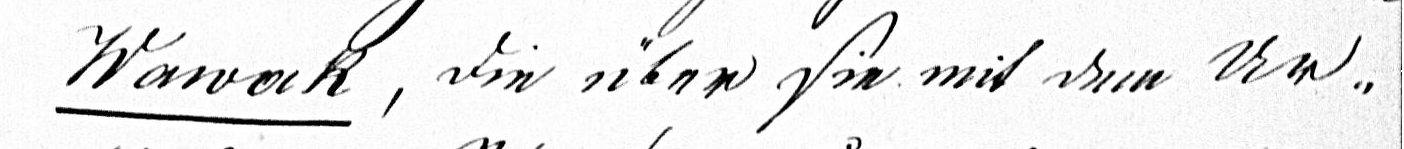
Wawak, die über sie mit dem Ur¬
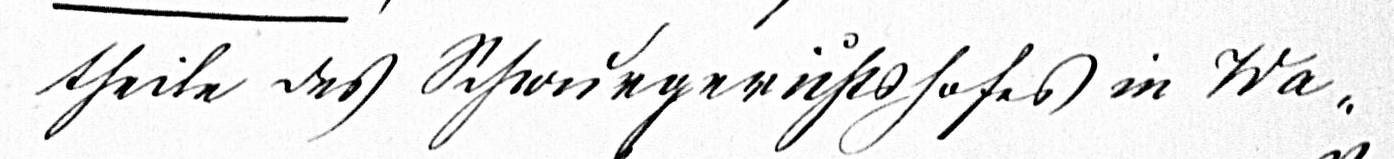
theile des Schwurgerichtshofes in Wa¬
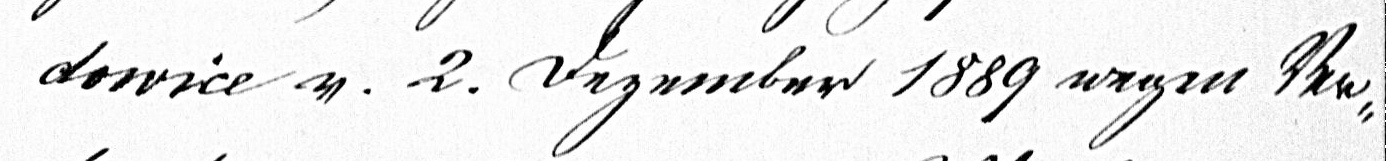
dowice v. 2. Dezember 1889 wegen Ver¬
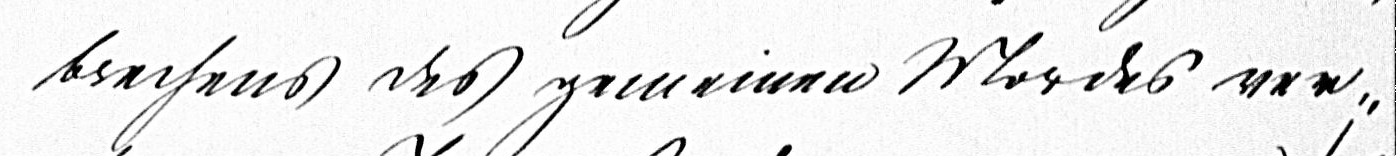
brechens des gemeinen Mordes ver¬
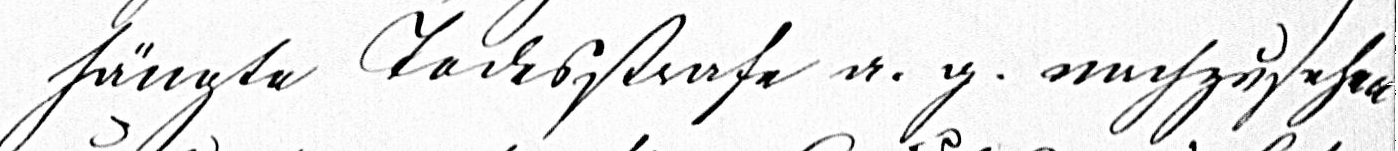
hängte Todesstrafe a. g. nachzusehen
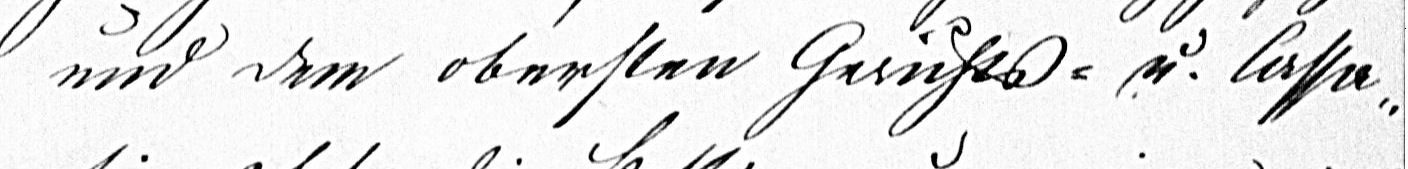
und dem obersten Gerichts- u. Cassa¬
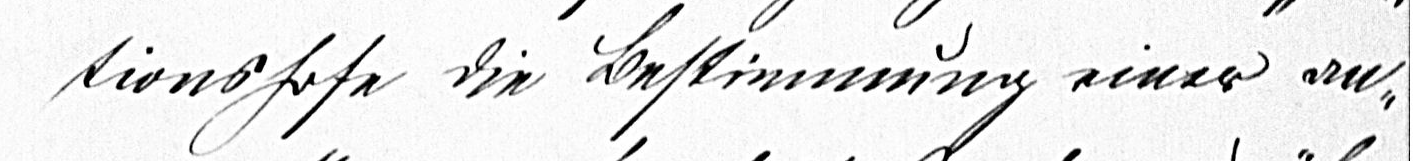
tionshofe die Bestimmung einer an¬
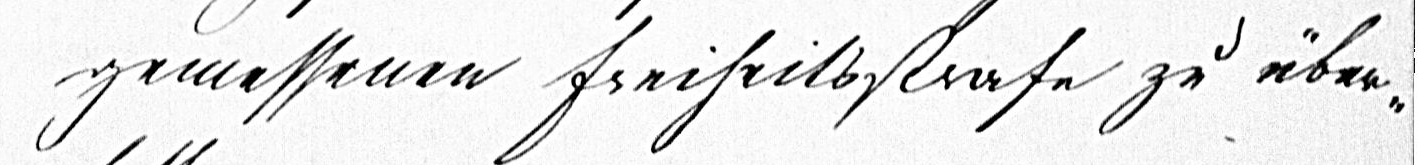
gemessenen Freiheitsstrafe zu über¬
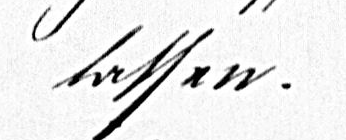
lassen.
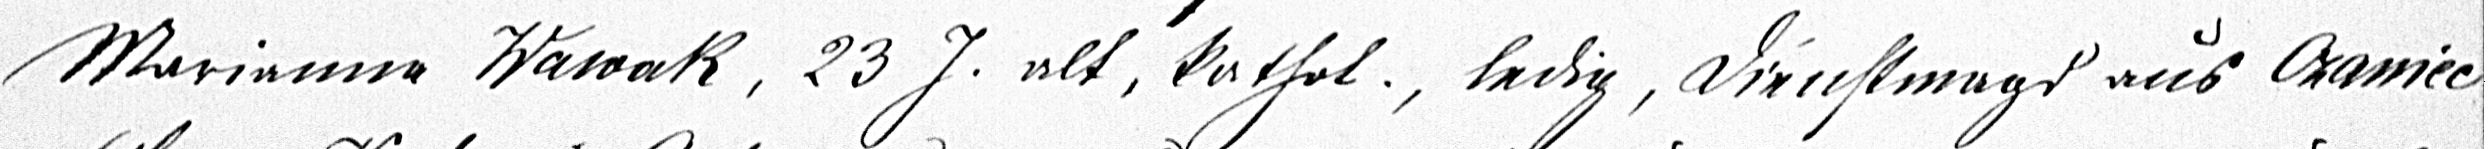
Marianne Wawak, 23 J. alt, kathol., ledig, Dienstmagd aus Ozaniec
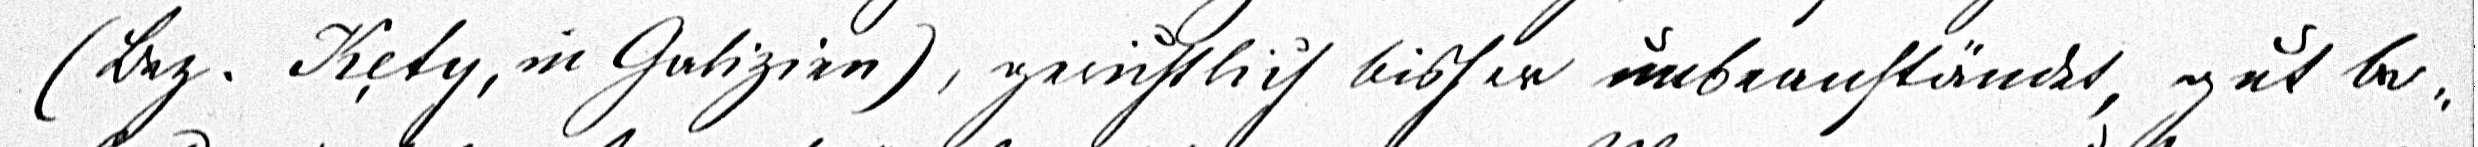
(Bez. Kęty, in Galizien), gerichtlich bisher unbeanständet, gut be¬
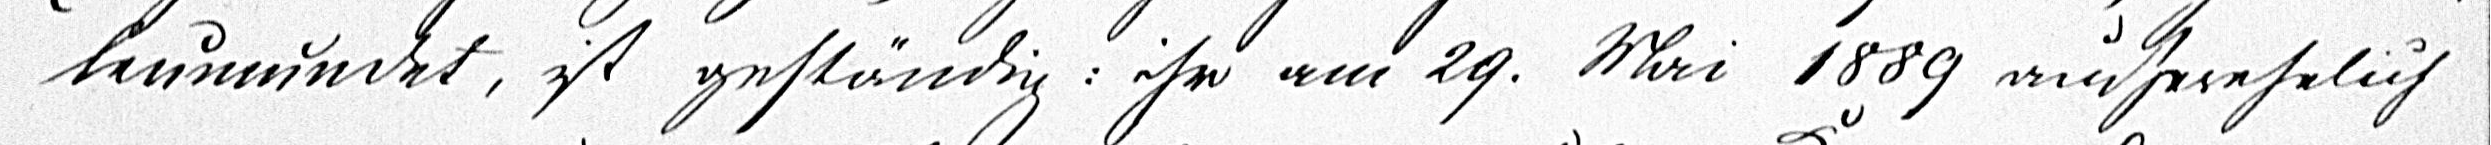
leumundet, ist geständig: ihr am 29. Mai 1889 außerehelich
